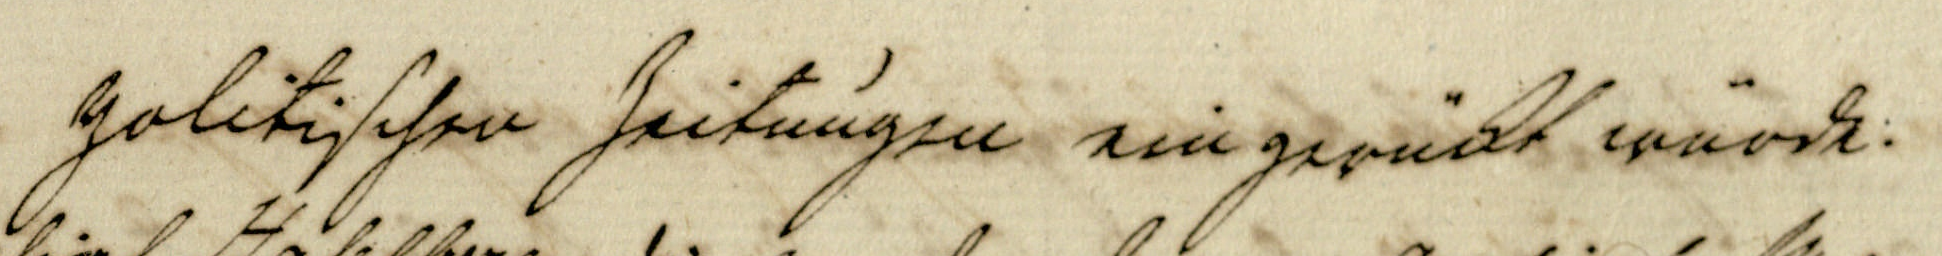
politischen Zeitungen eingerückt würde.
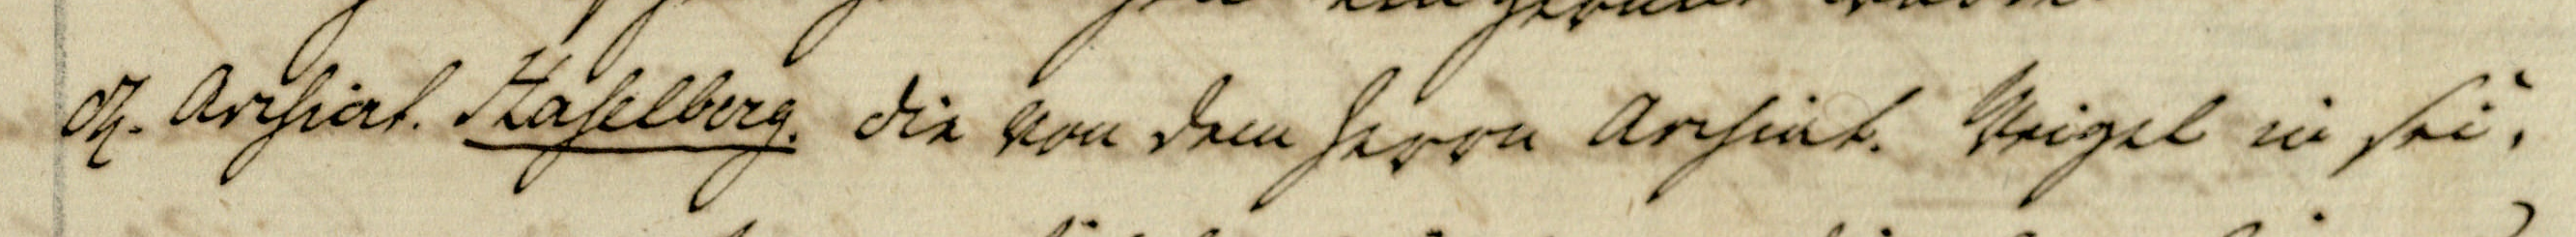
dh. Archiat. Haselberg. Die von dem Herrn Archiat. Weigel in sei¬
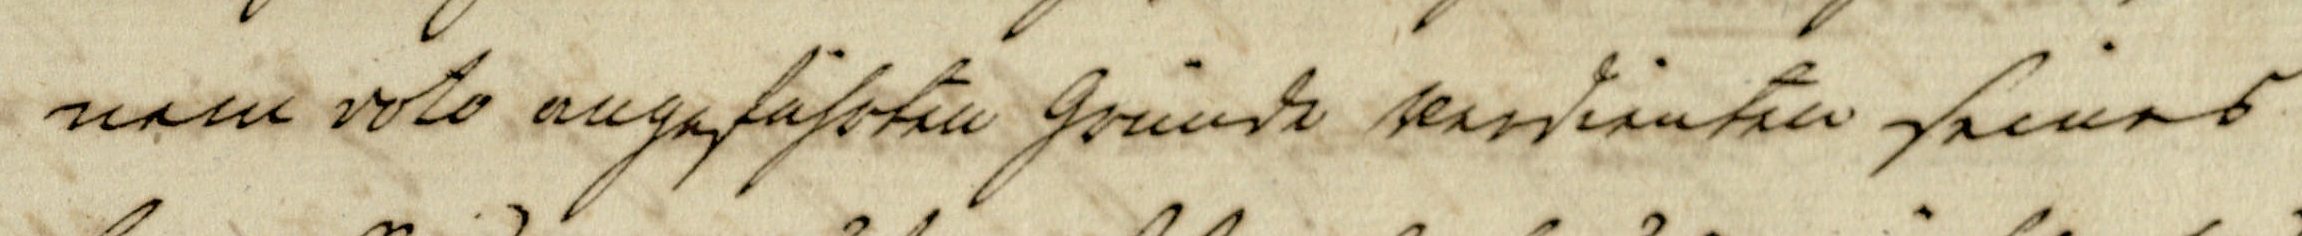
nem voto angeführten Gründe verdienten seines
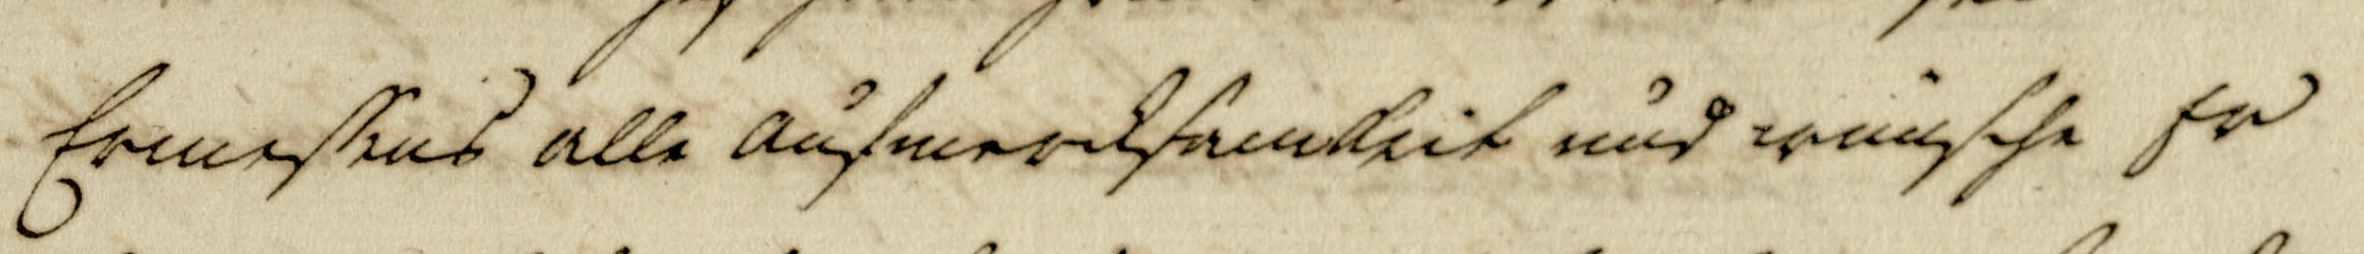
Ermessens alle Aufmercksamkeit und wünsche Er
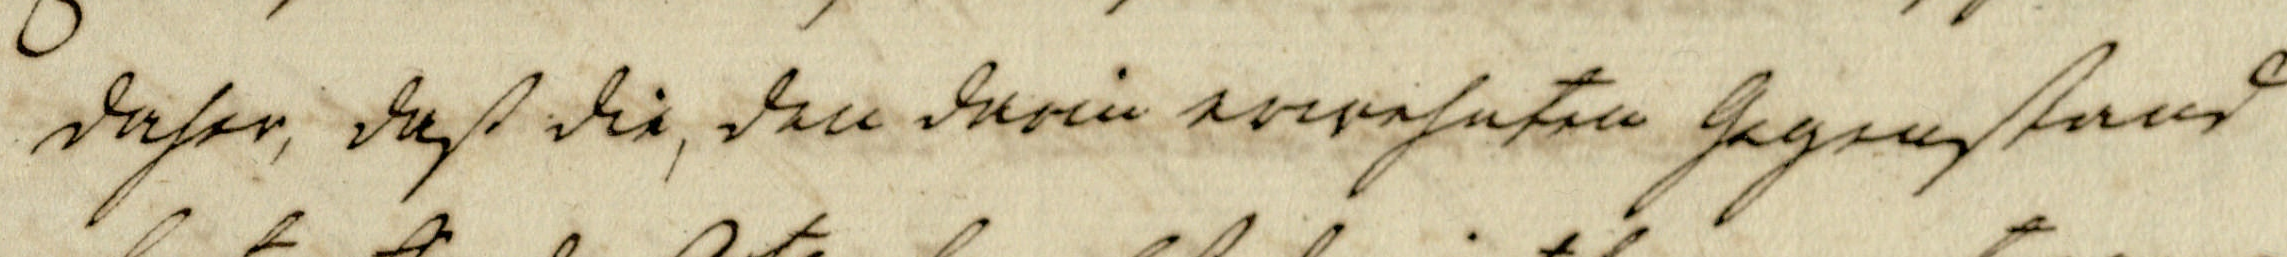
daher, daß die, den darin erwehnten Gegenstand
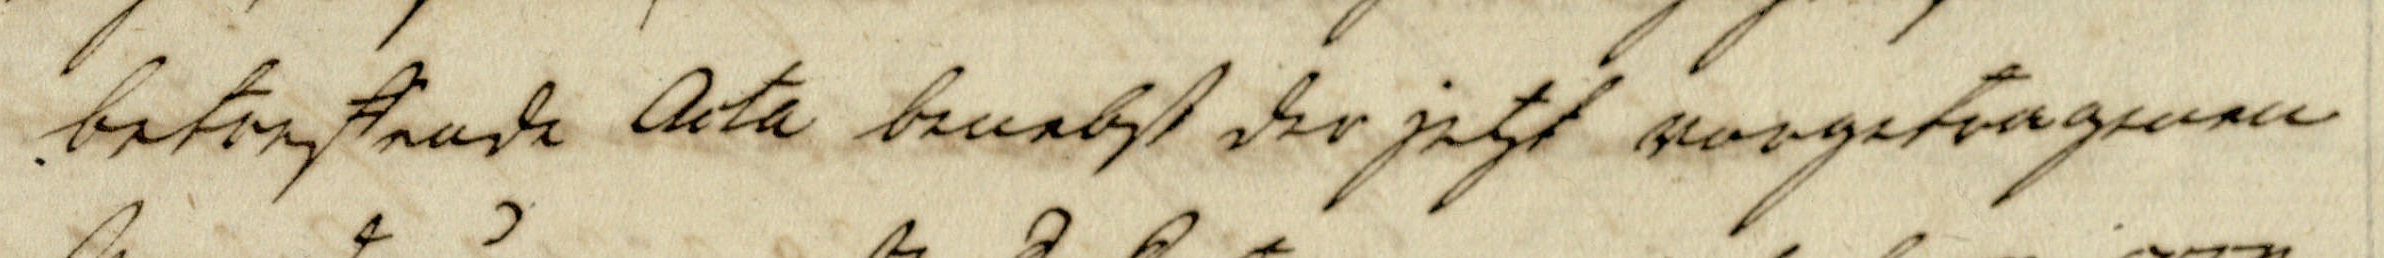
betreffende Acta benebst der jetzt vorgetragenen
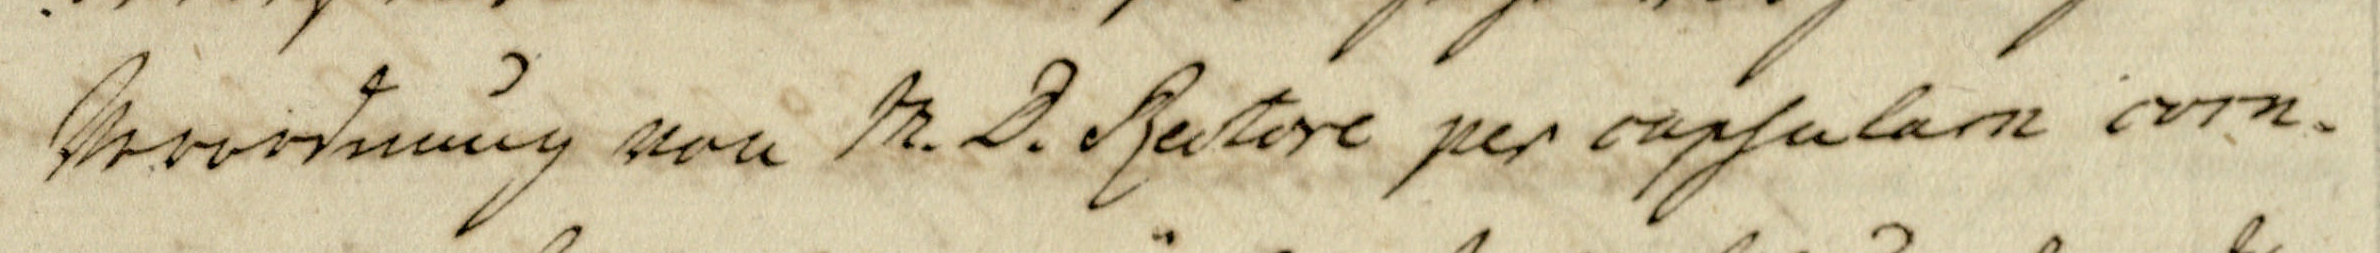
Verordnung von M. D. Rectore per cepsulam com¬
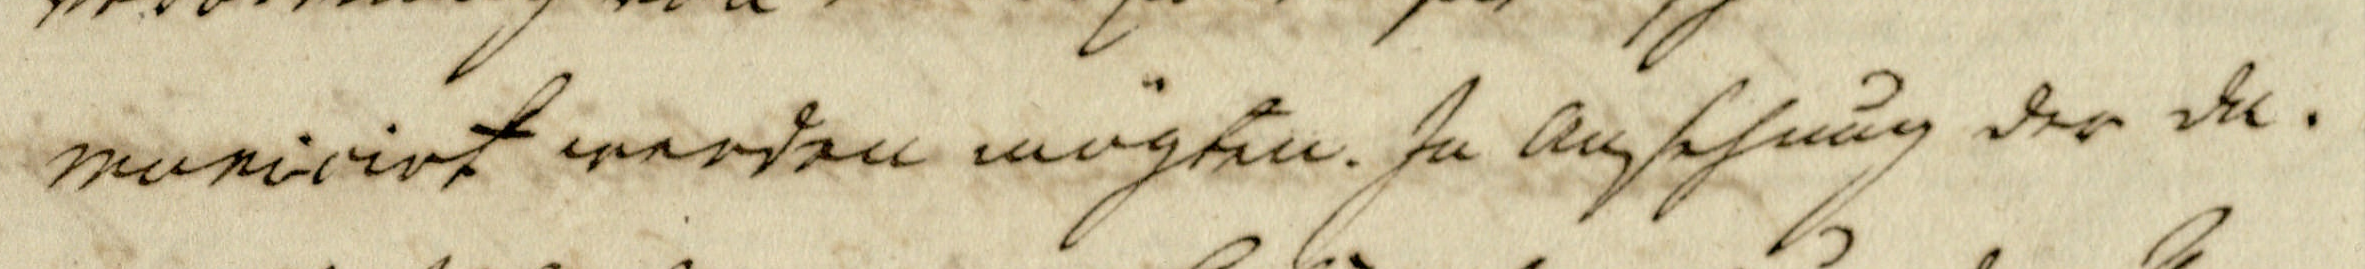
municirt werden mögten. In Ansehung der da¬
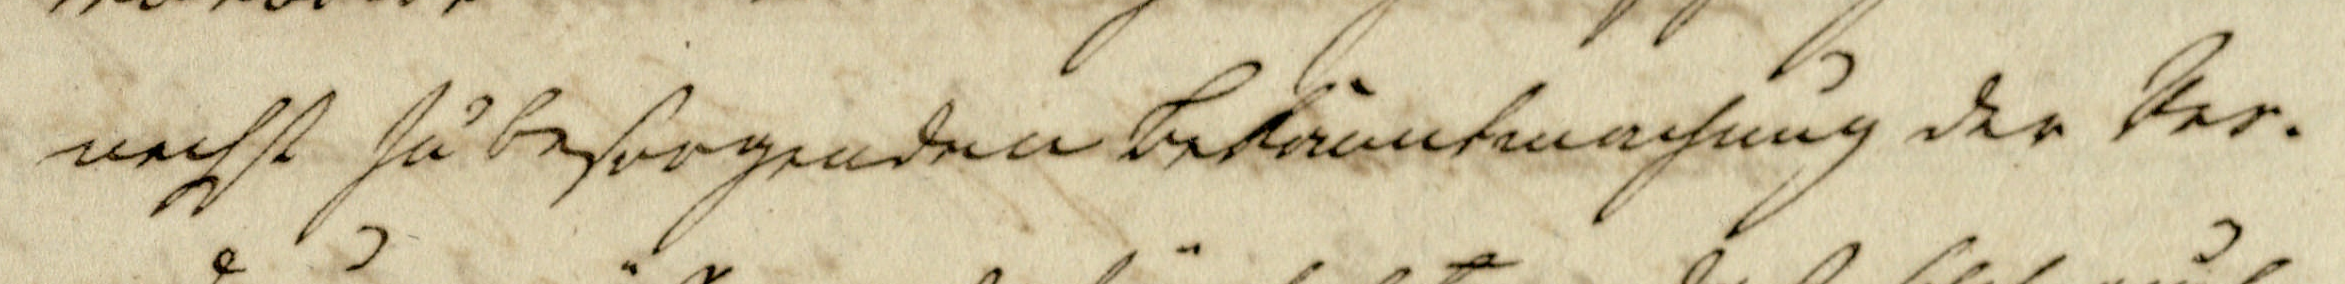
nechst zu besorgenden Bekanntmachung der Ver¬
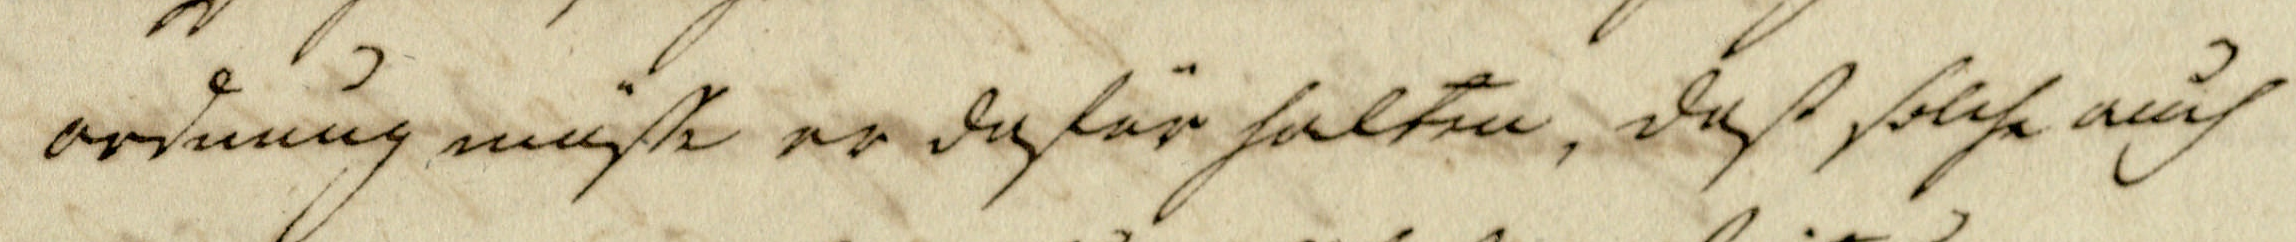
ordnung müsse er dafür halten, daß solche auch
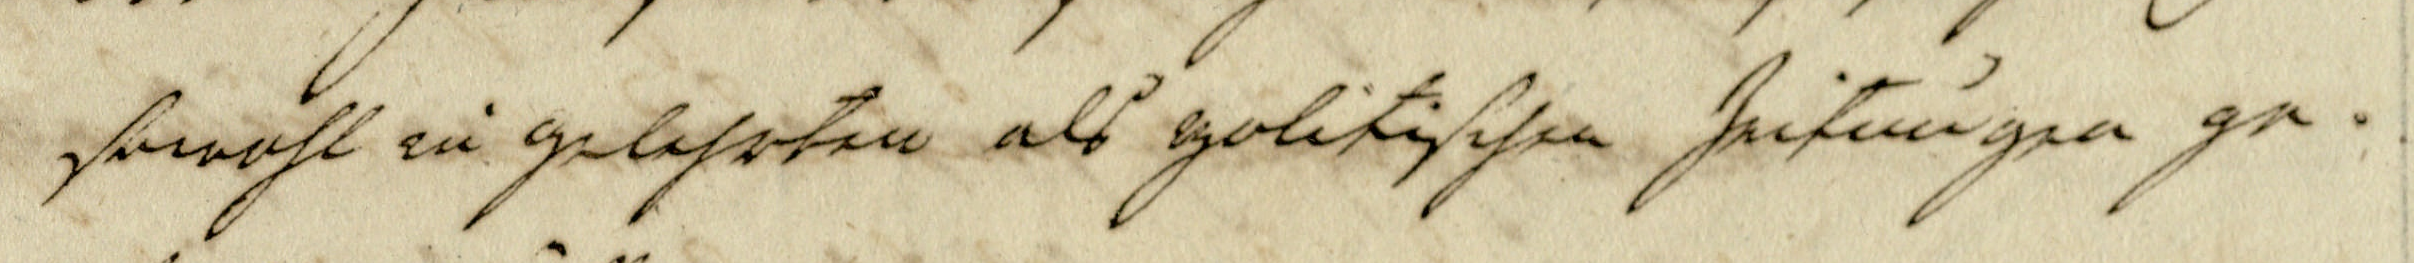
sowohl in gelehrten als politischen Zeitungen ge¬
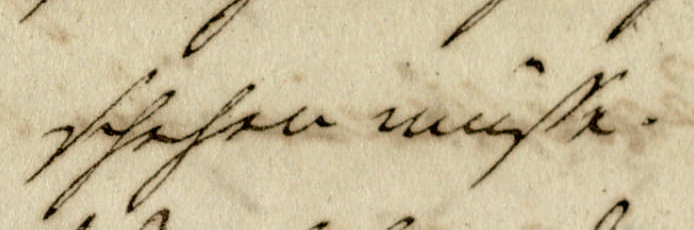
schehen müsse.
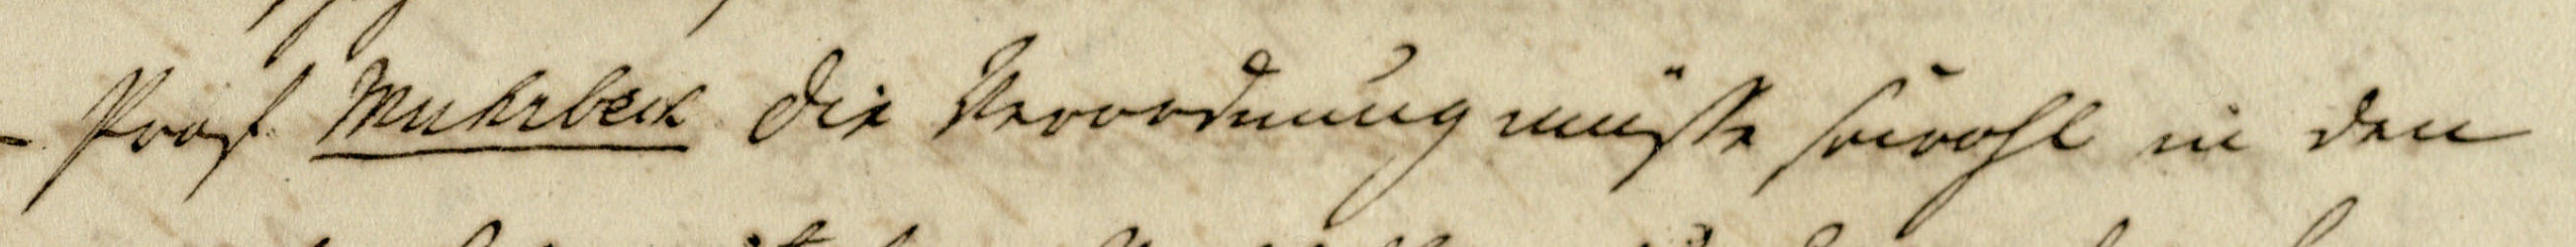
Prof. Muhrbeck die Verordnung müsse sowohl in den
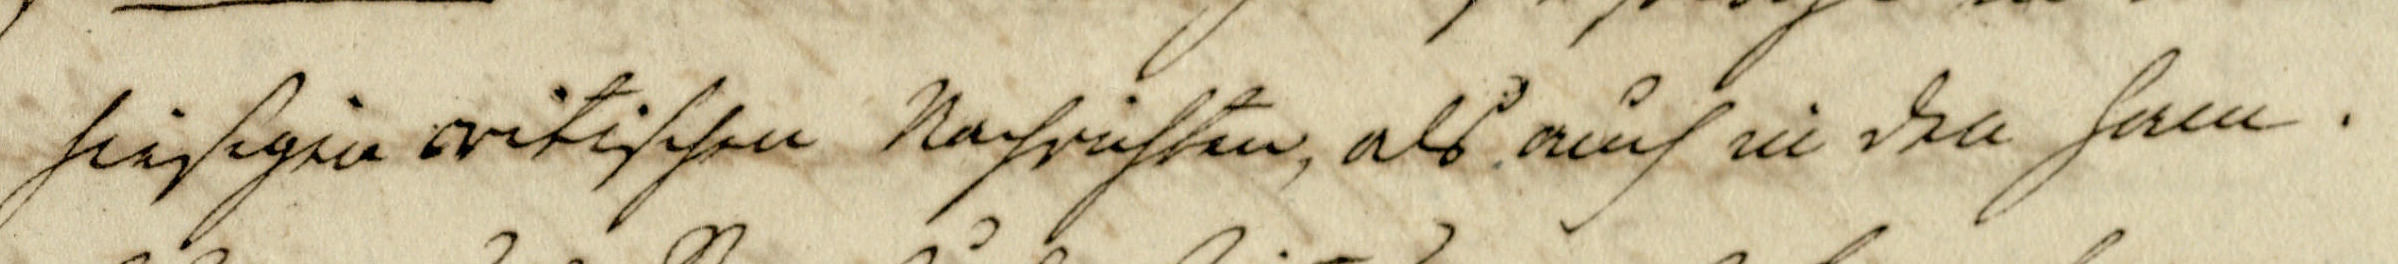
hiesigen critischen Nachrichten, als auch in den Ham¬
